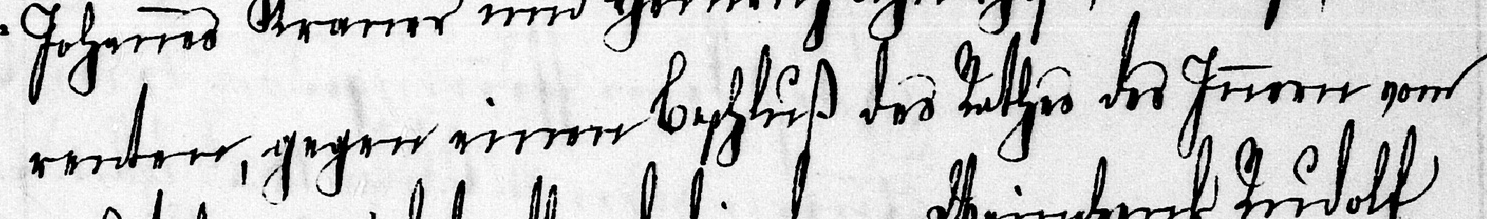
renten, gegen einen Beschluß des Rathes des Innern vom
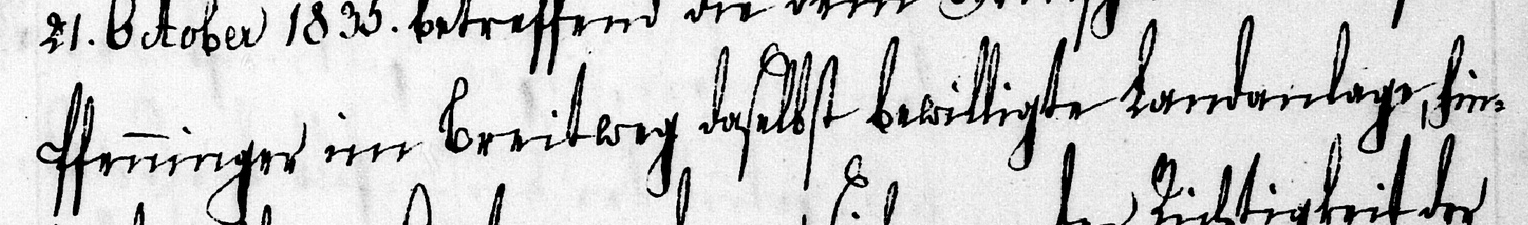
Pfenninger im Breitweg daselbst bewilligte Landanlage, hi¬
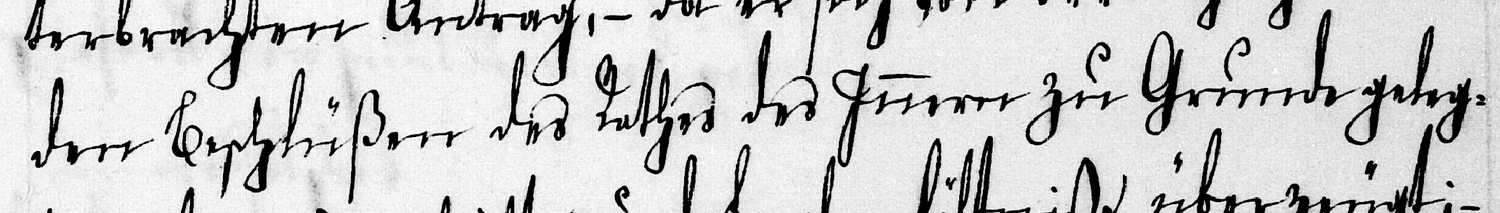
den Beschlüßen des Rathes des Innern zu Grunde geleg¬
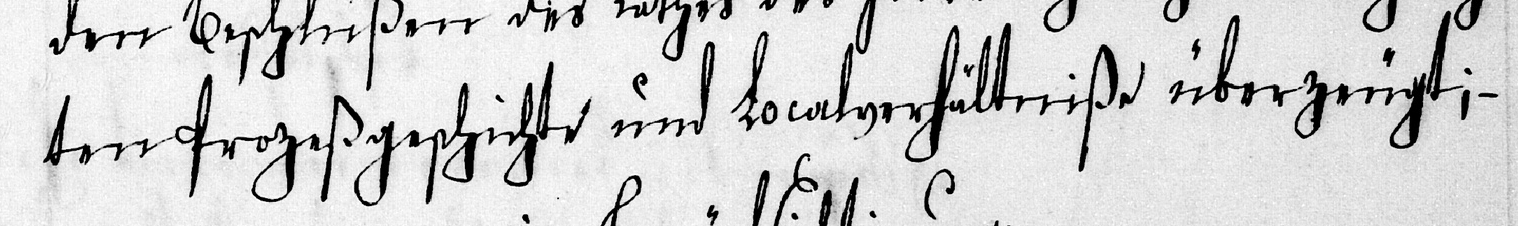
ten Prozeßgeschichte und Localverhältniße überzeugt;
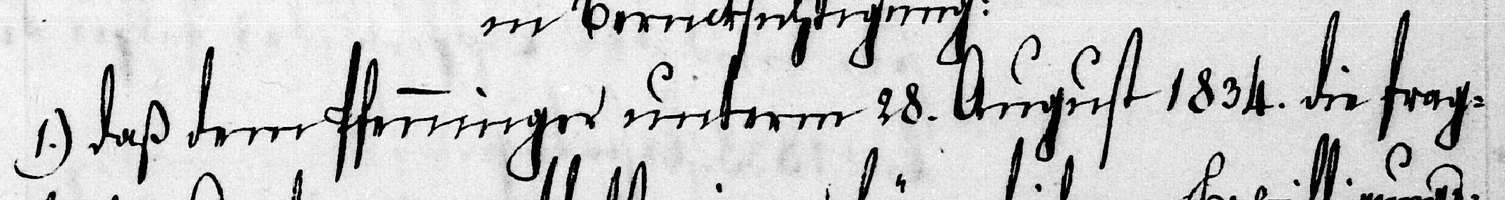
1.) Daß dem Pfenninger unterm 28. August 1834. die frag¬
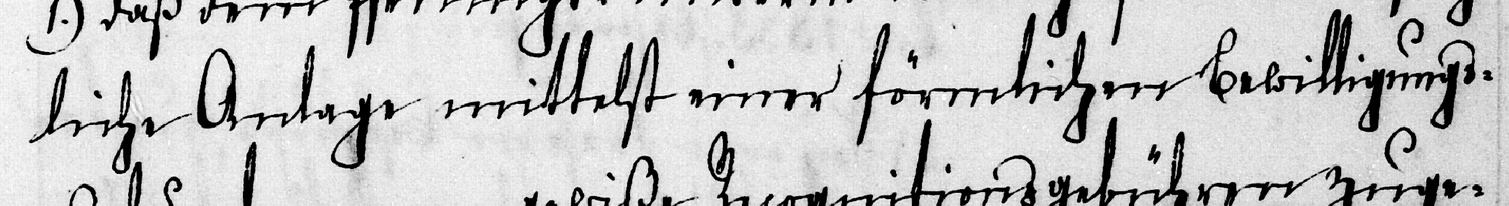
liche Anlage mittelst einer förmlichen Bewilligungs¬
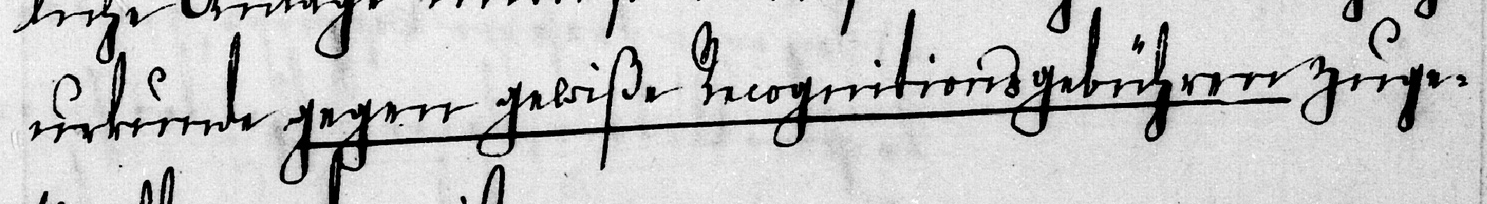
urkunde gegen gewiße Recognitionsgebühren zuge¬
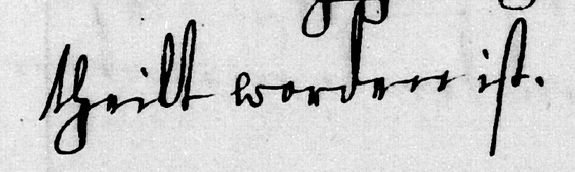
theilt worden ist.
